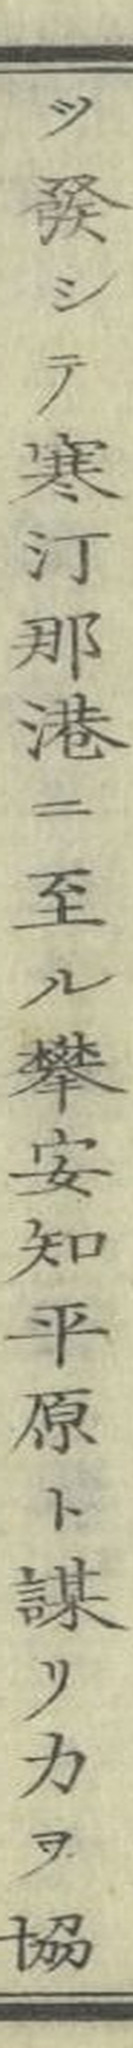ツ發シテ寒汀那港ニ至ル攀安知平原ト謀リ力ヲ協
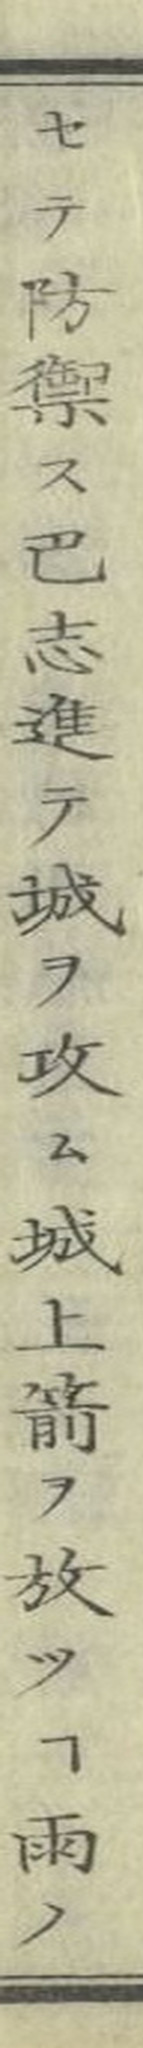セテ防禦ス巴志進テ城ヲ攻ム城上箭ヲ放ツコト雨ノ
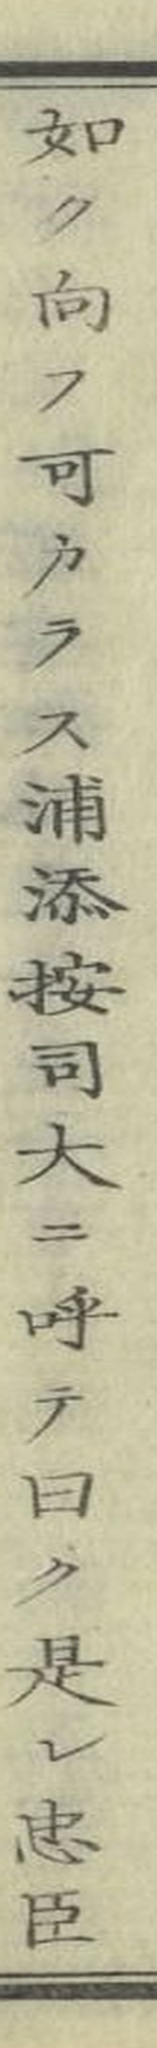如ク向フ可カラス浦添按司大ニ呼テ曰ク是レ忠臣
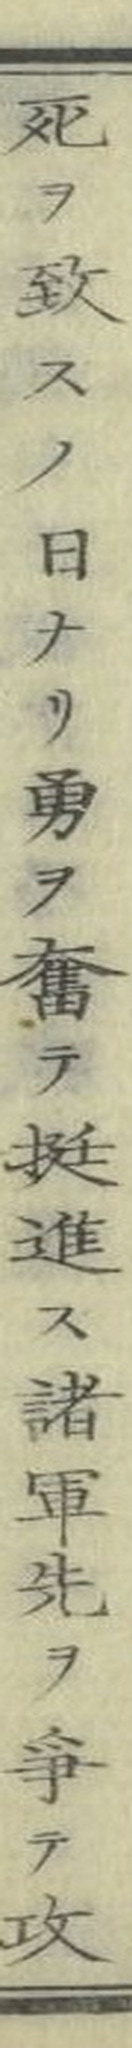死ヲ致スノ日ナリ勇ヲ奮テ挺進ス諸軍先ヲ爭テ攻

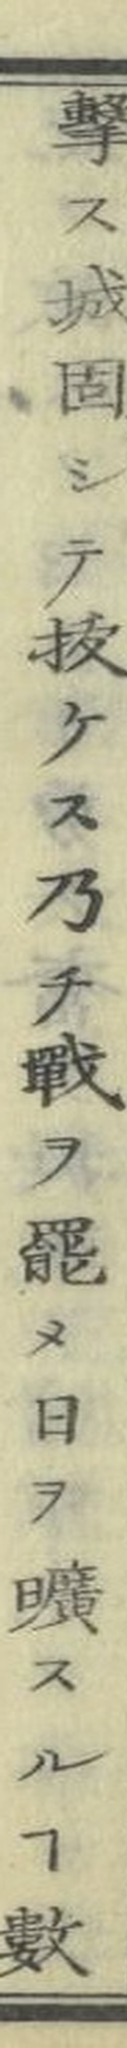擊ス城固シテ拔ケス乃チ戰ヲ罷メ日ヲ曠スルコト數
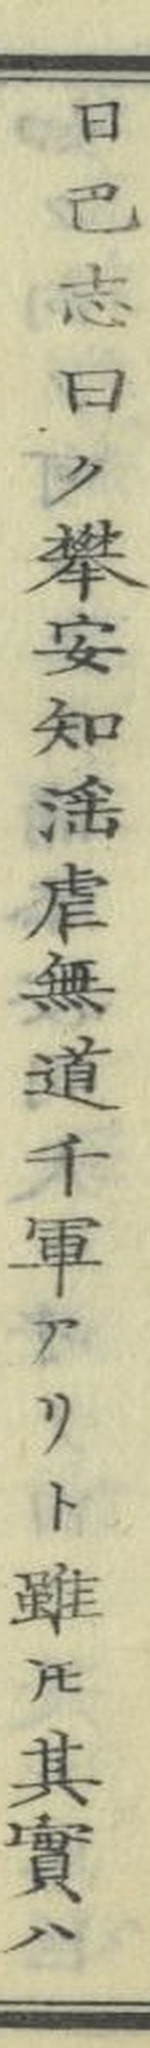日巴志曰ク攀安知虐無道千軍アリト雖トモ其實ハ
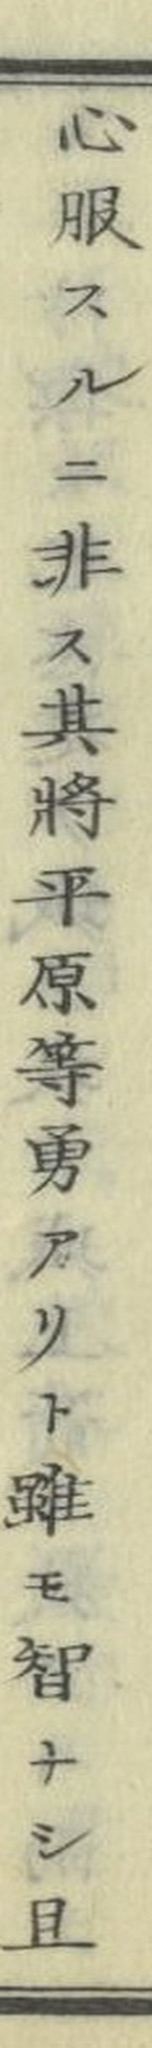心服スルニ非ス其將平原等勇アルト雖モ智ナシ且
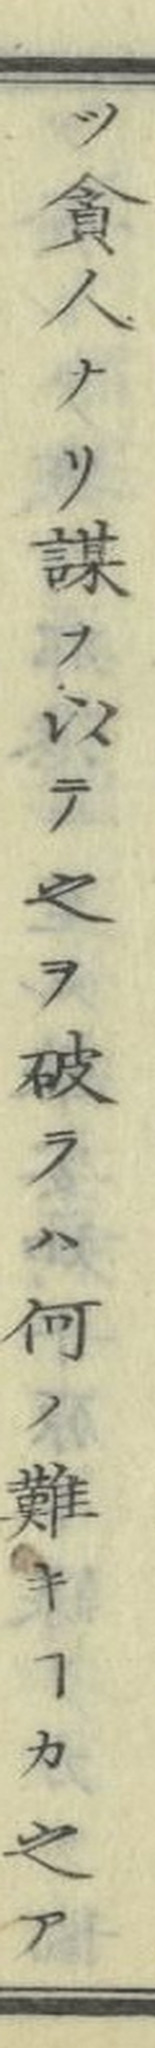ツ貪人ナリ謀ヲ以テ之ヲ破ラハ何ノ難キコトカ之ア
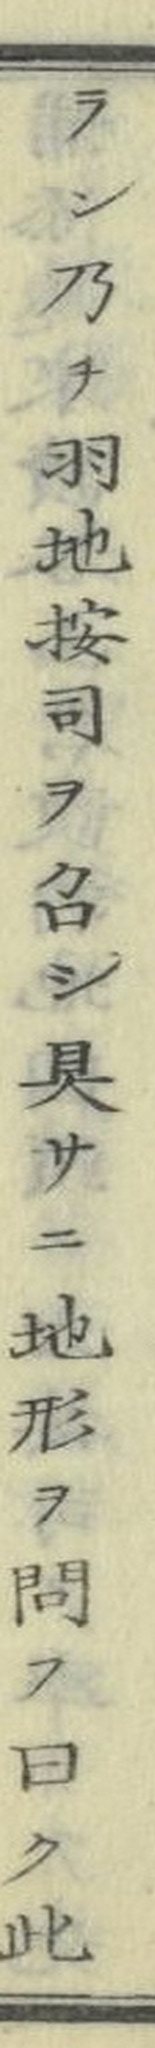ラン乃チ羽地按司ヲ召シ具サニ地形ヲ問フ曰ク此
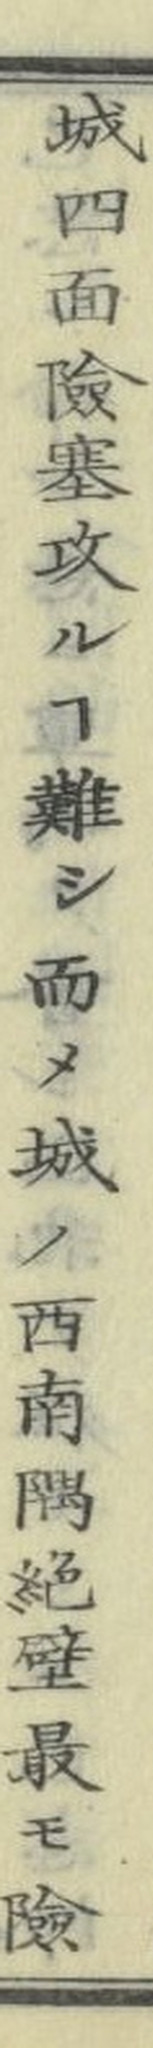城四面險塞攻ルコト難シ而シテ城ノ西南隅絶壁最モ險
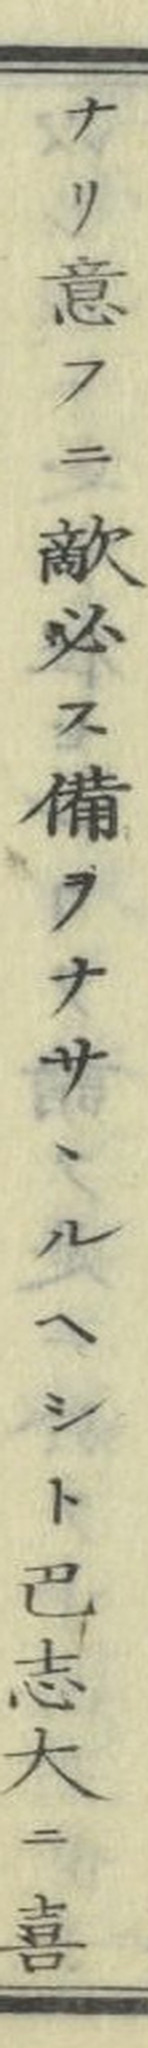ナリ意フニ歒必ス備ヲナサヽルヘシト巴志大ニ喜
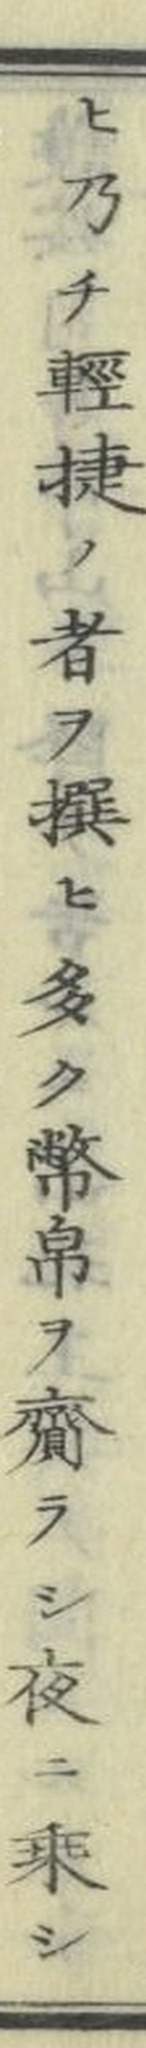ヒ乃チ輕捷ノ者ヲ撰ヒ多ク幣帛ヲ齎ラシ夜ニ乘シ
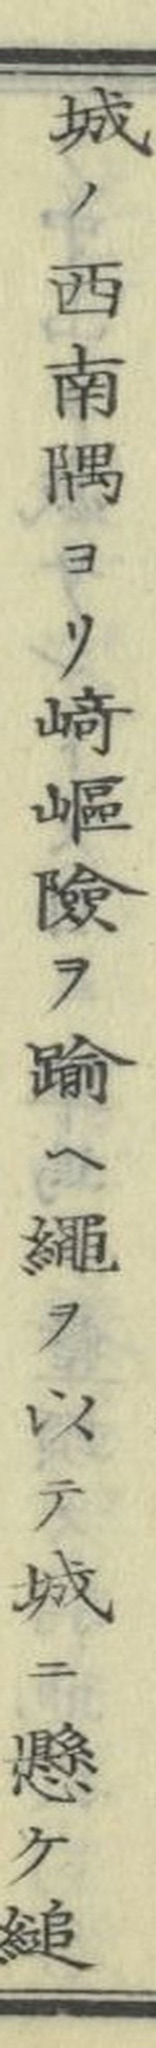城ノ西南隅ヨリ崎嶇險ヲ踰ヘ縄ヲ以テ城ニ懸ケ縋
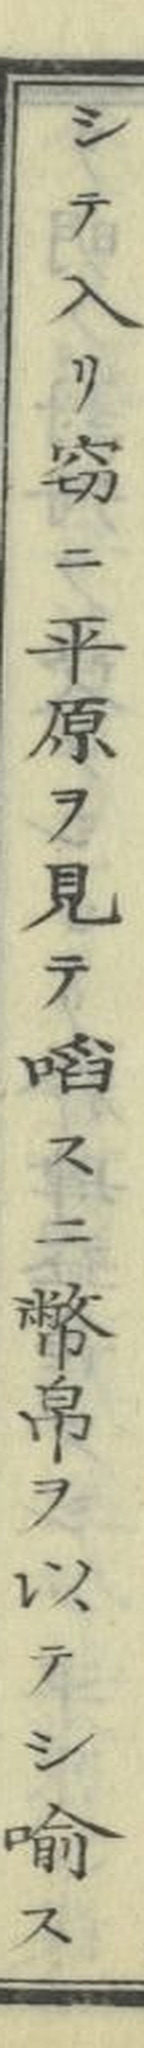シテ入リ窃ニ平原ヲ見テ㗖スニ幣帛ヲ以テシ喻ス
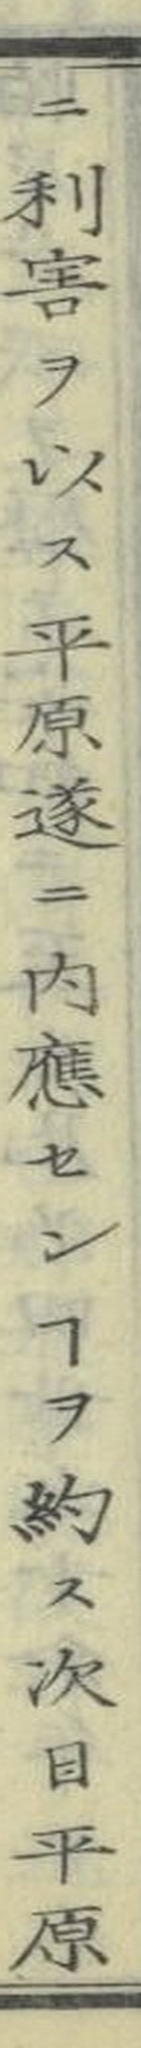ニ利害ヲ以ス平原遂ニ內應センコトヲ約ス次日平原
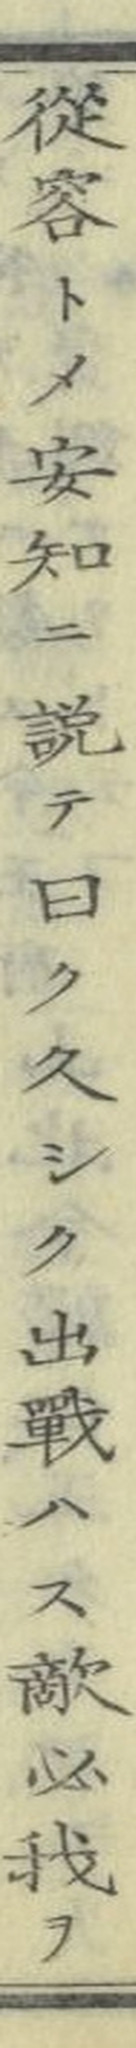從容トシテ安知ニ說テ曰ク久シク出戰ハス歒必我ヲ
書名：琉球藩史 一之巻
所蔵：University of the Ryukyus Library
